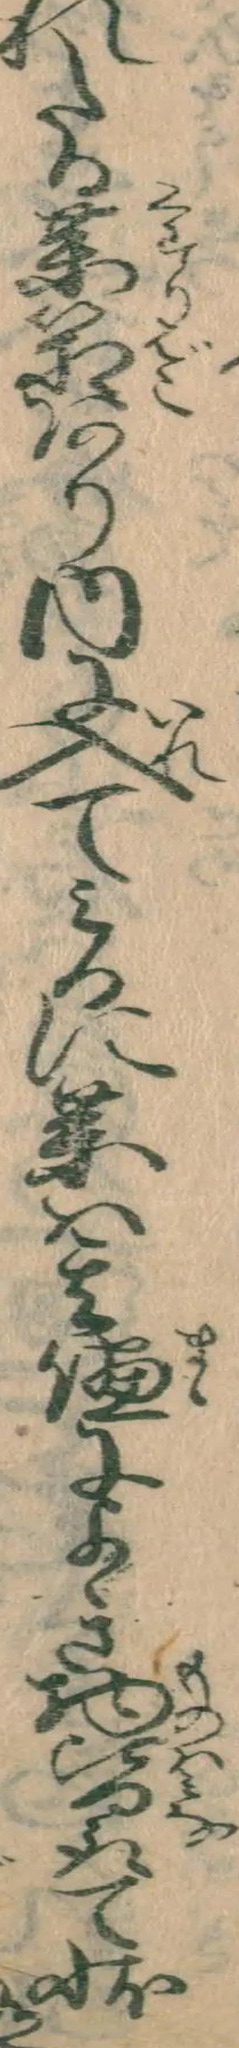れたる薬箱あり内に入てみるに薬は其侭によき物皆取て状有
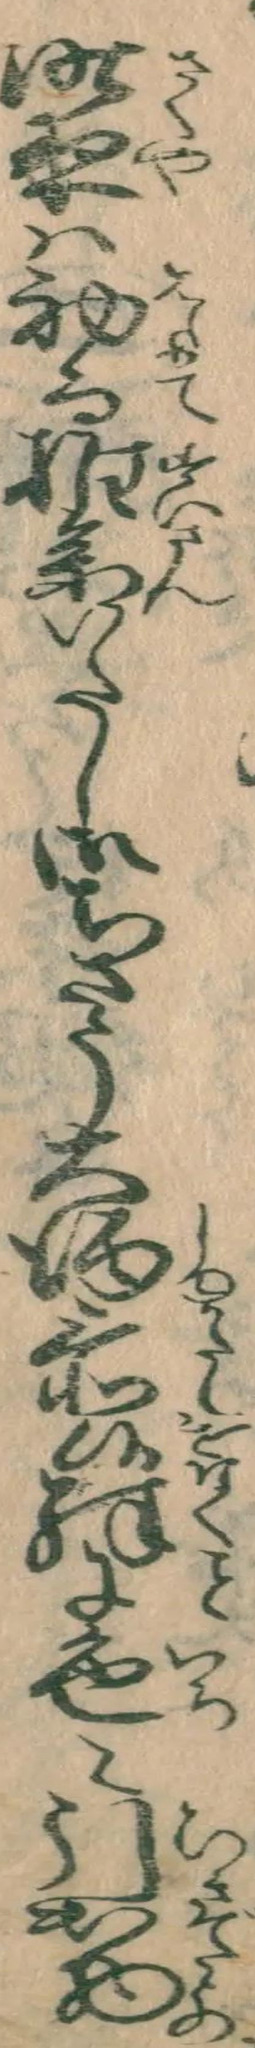昨夜は初て推参いたし御ちさう大酒忝候殊に色々引出物
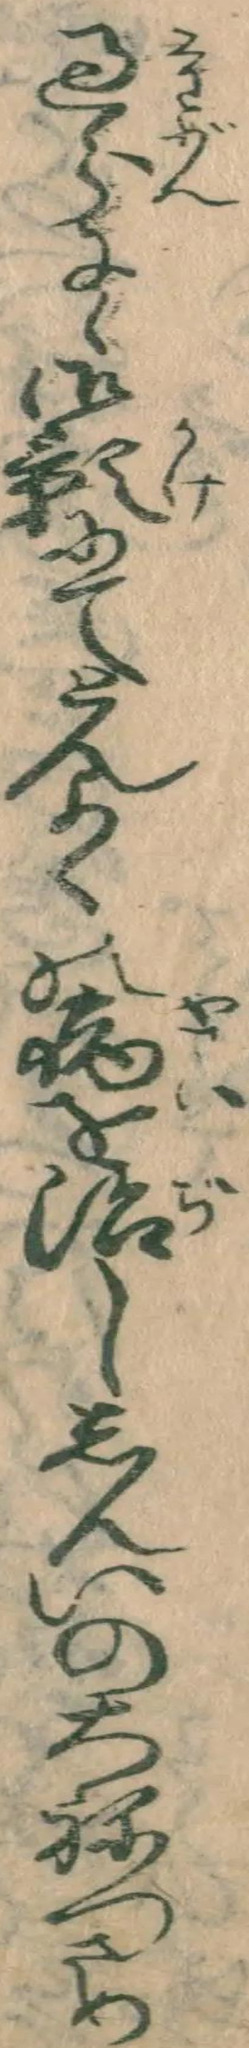過分に候御影にてとんよくの病を治ししんいの大ねつさめ
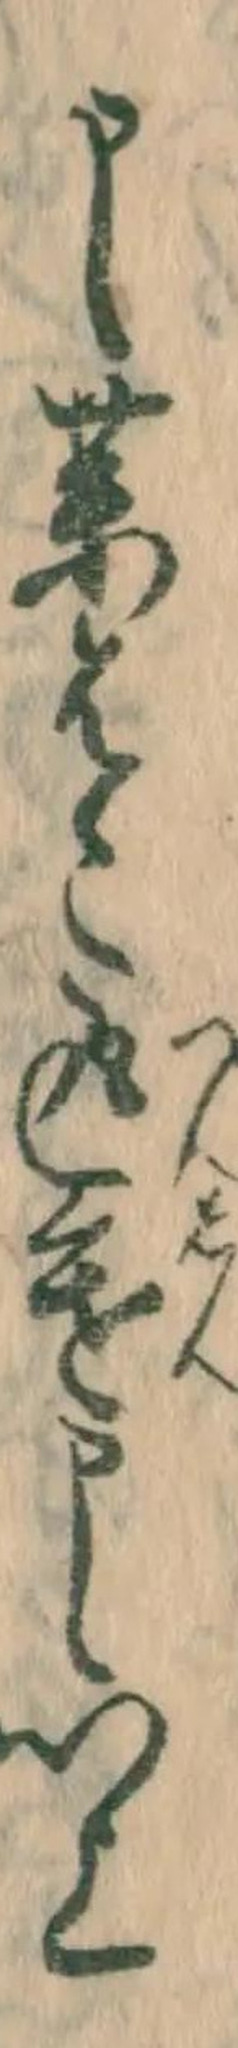申薬はこ返進申候以上
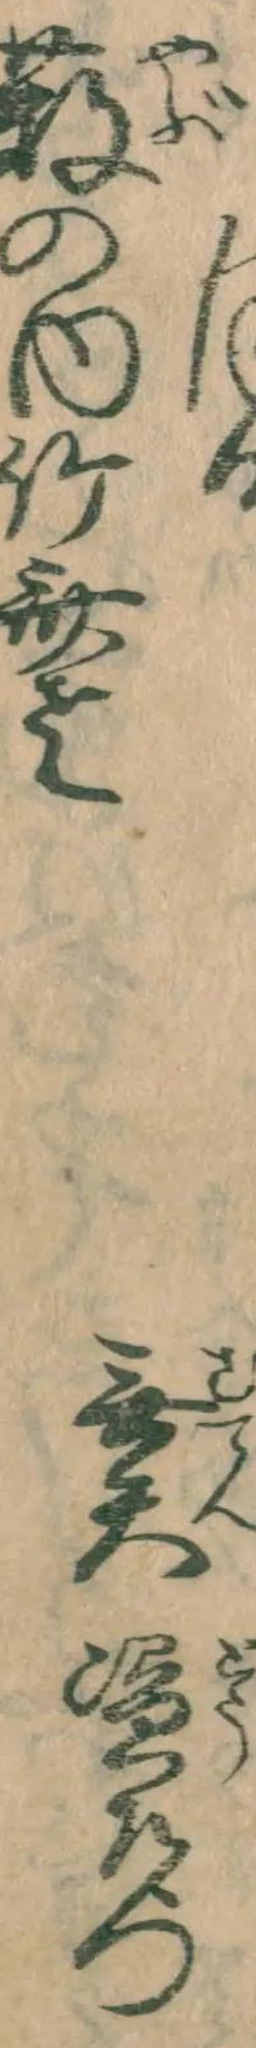薮の内竹斎老無天盗左衛門

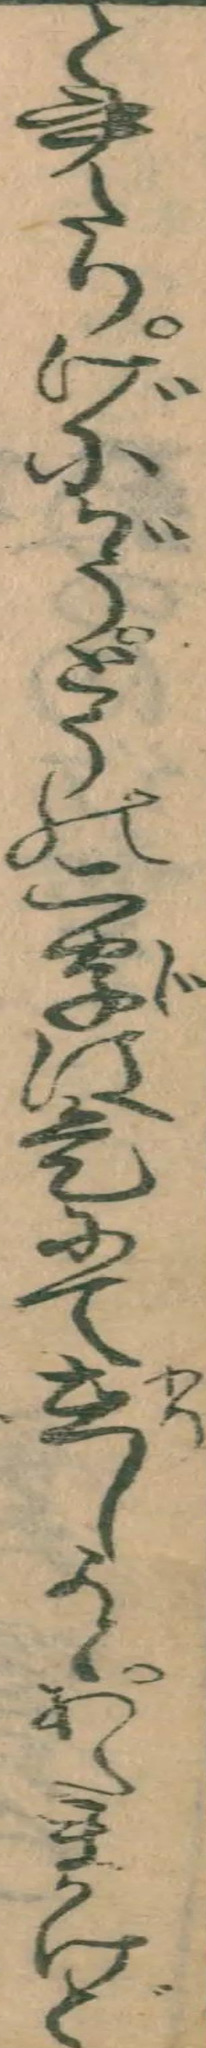と書たり。げにがう。とうの二字は是にて在しよし。あたまかけど
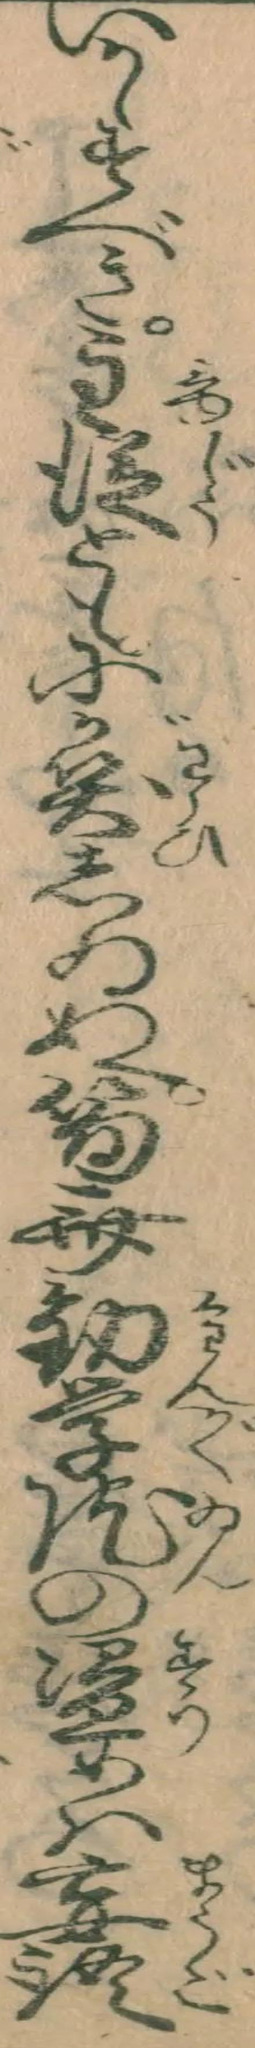いかゝすべき。主従ともにが笑しゐぬ。筍斎勧学院の盗めは妄語
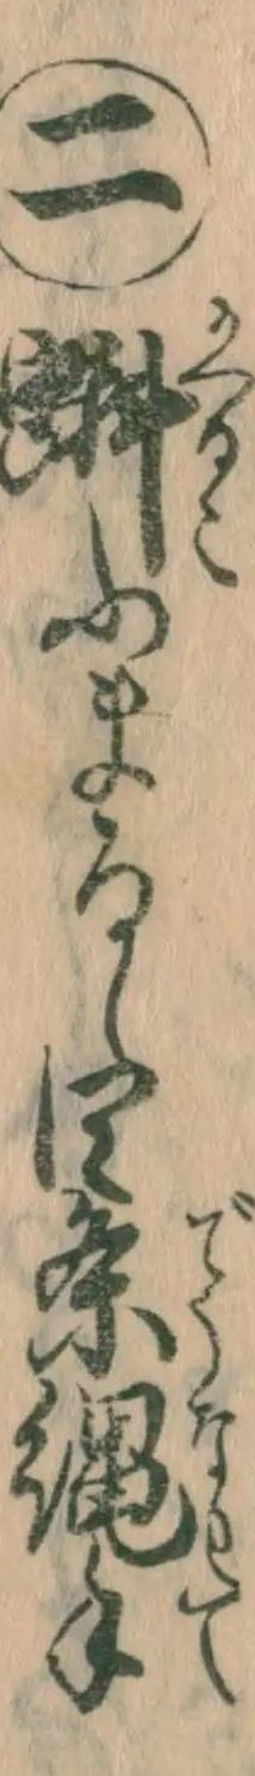二蝌ふまるし四条縄手
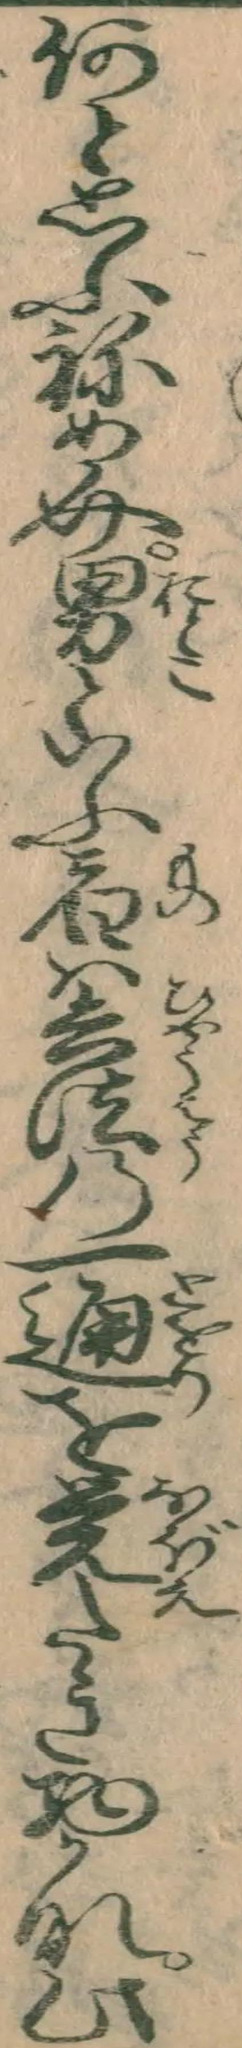何と思ふねめ介。男といふ者は兵法の一通を覚たき物かな。此
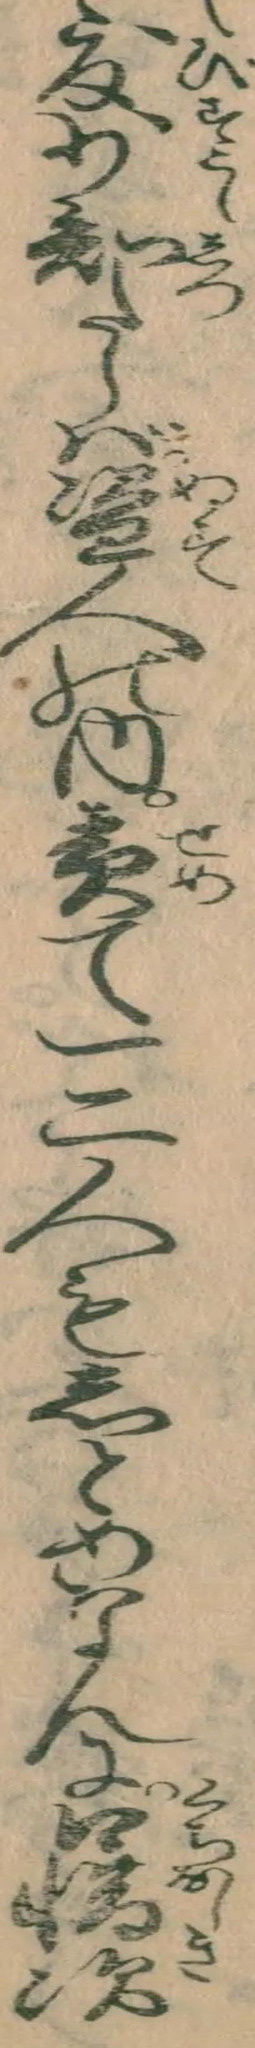度少知たらば。盗人の内。責て一二人もしとめなんに。口惜次
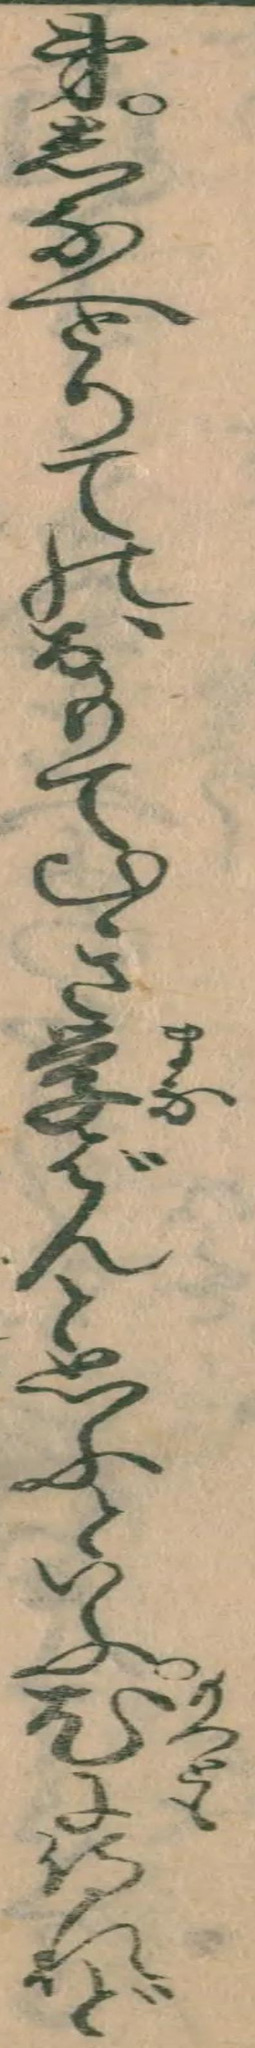第。しなへとりてのおもてむき学ばんと思ふといふ。尤に侍れど
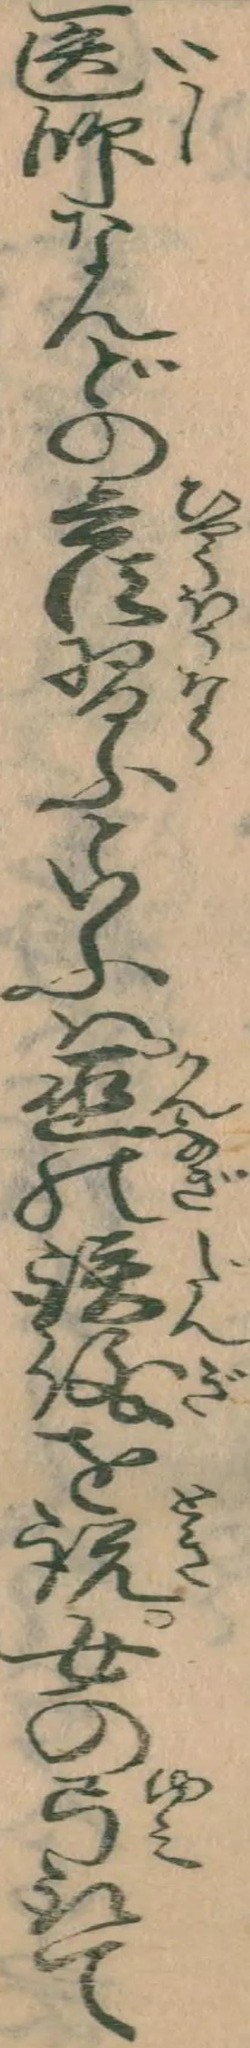医師なんどの兵法習ふといふは、巫の談儀を説。女の弓取て
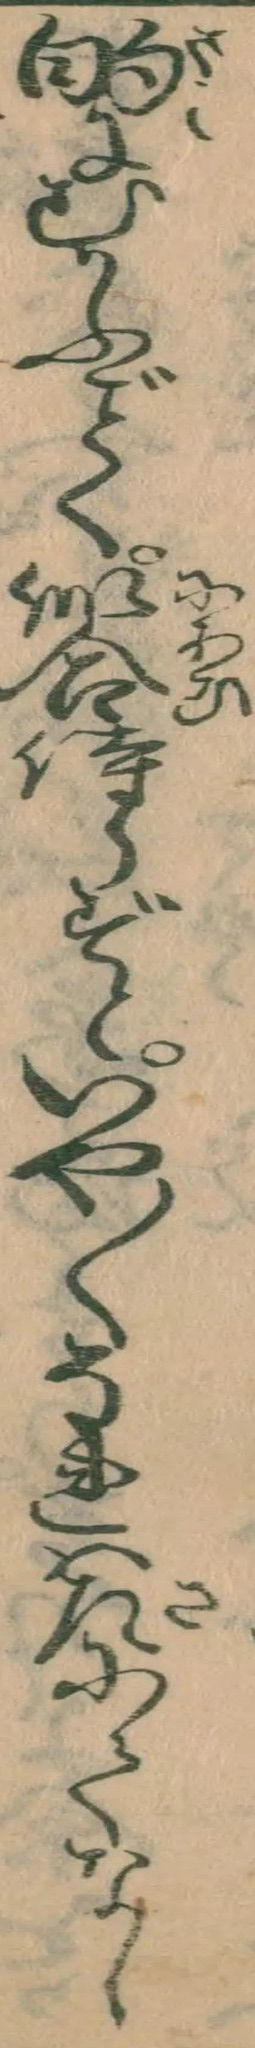的にむかふごとく。似合侍らずと。いや〳〵それは左にてなし
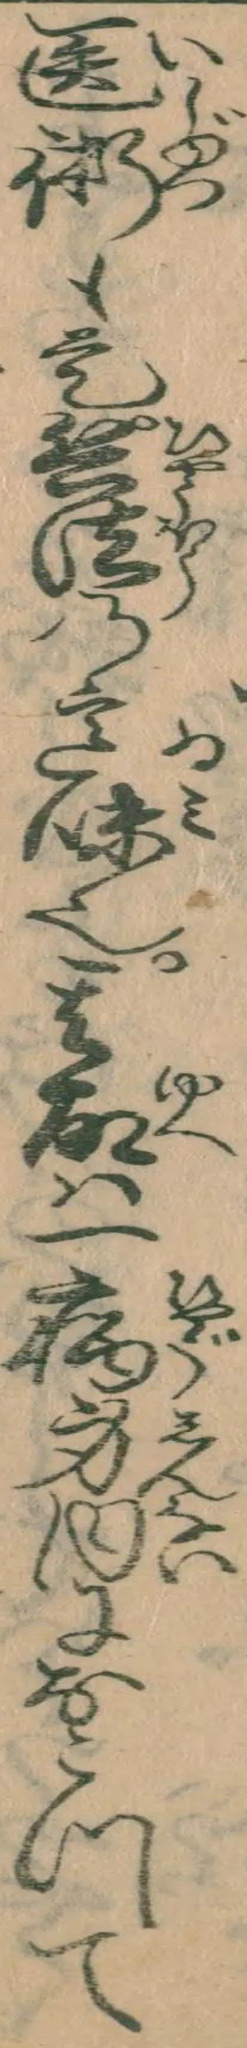医術も是兵法の意味也。其故は一病身内におこつて
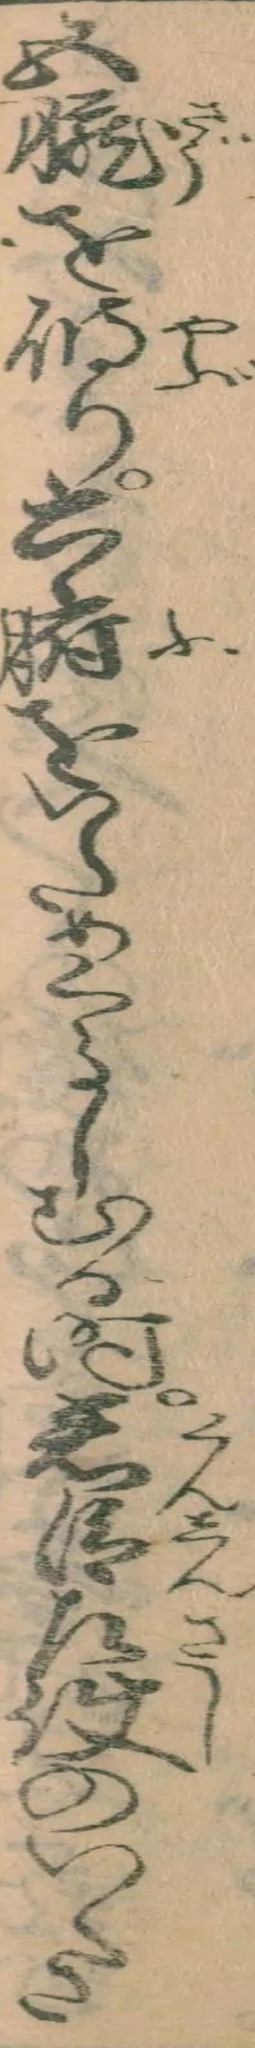五臓を破り。六腑をいためくるしむる時。君臣左使のいたさ
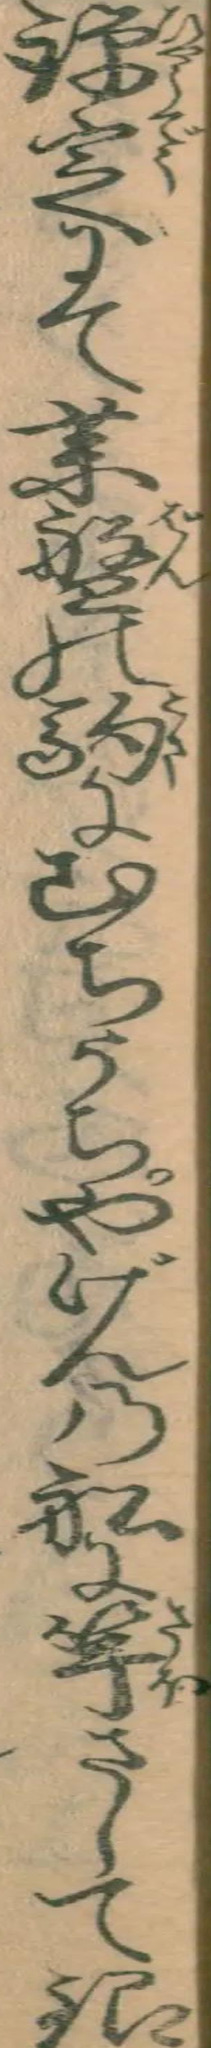評定にて薬盤の駒にむちうち。やげんの船に竿さして銀
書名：新竹斎 5巻
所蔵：国立国会図書館 National Diet Library, JAPAN
